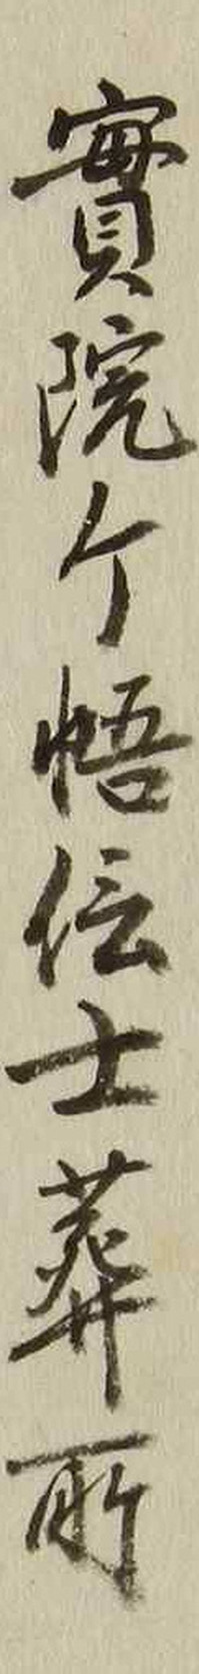実院ケ悟信士葬所
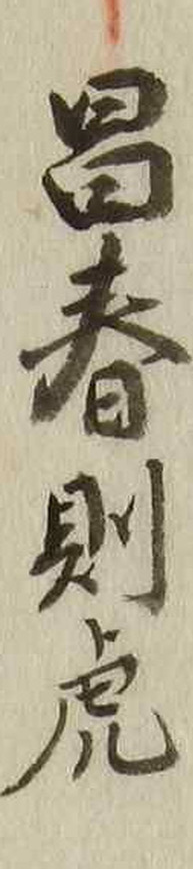昌春則虎
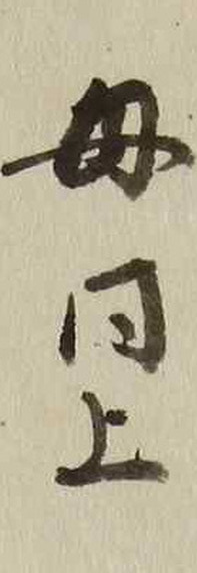母同上
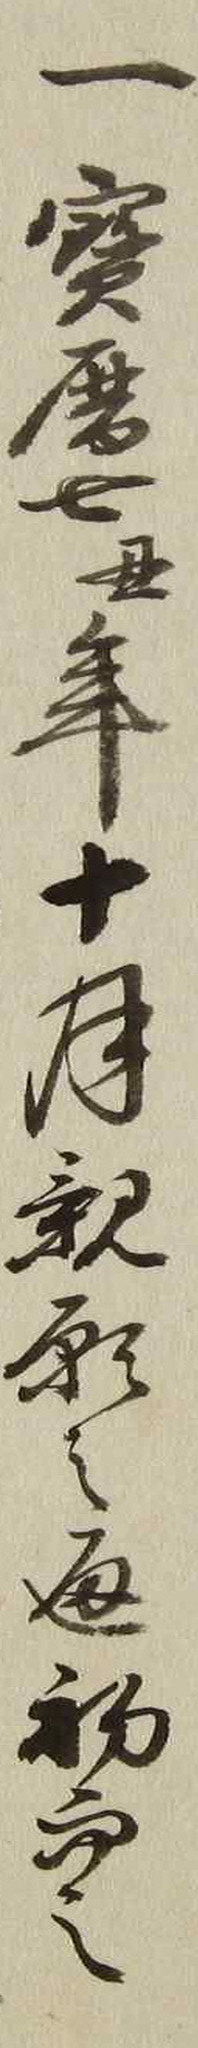一宝暦七丑年十月親願之通初而之
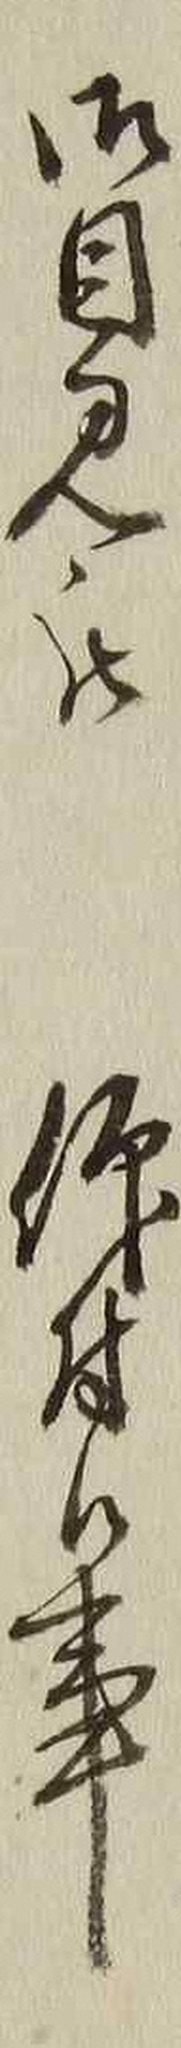御目見被仰付候事
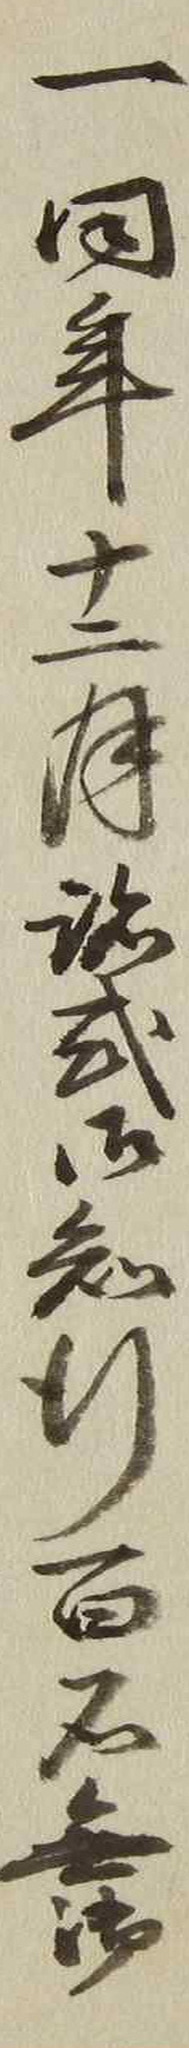一同年十二月跡式御知行百石無御
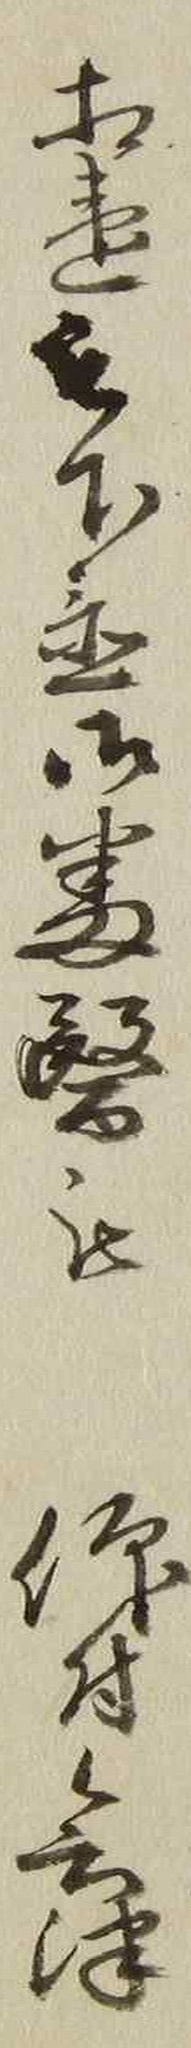相遣被下置御番医被仰付会津
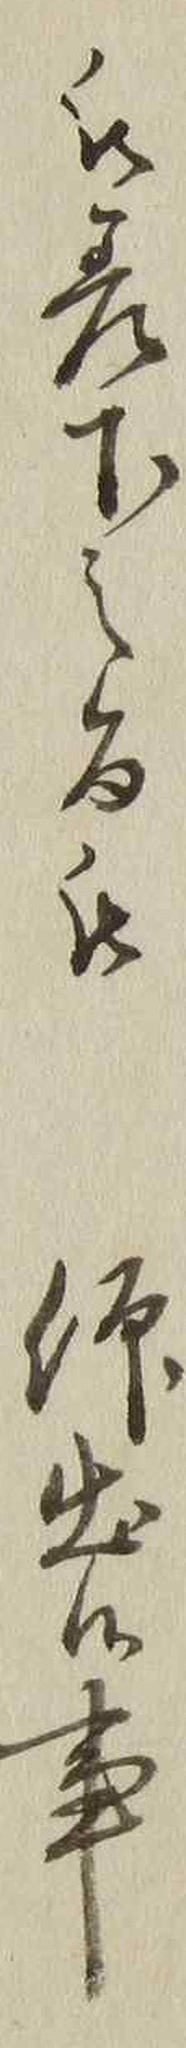被差下之旨被仰出候事
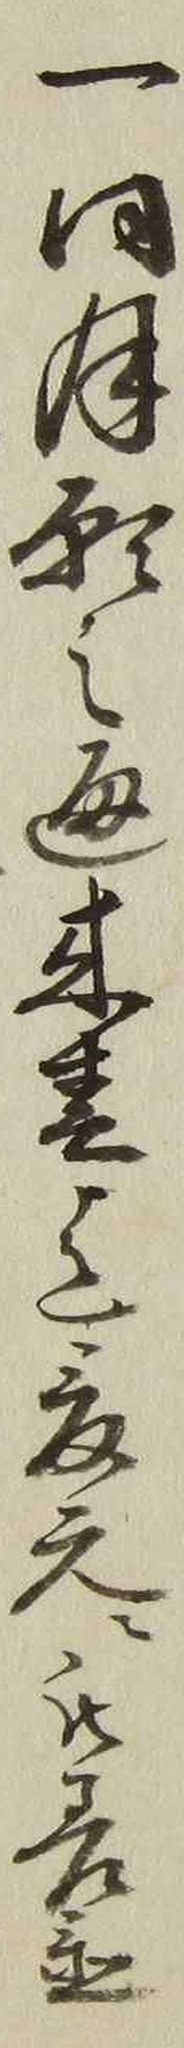一同月願之通来春迄爰元ニ被差置
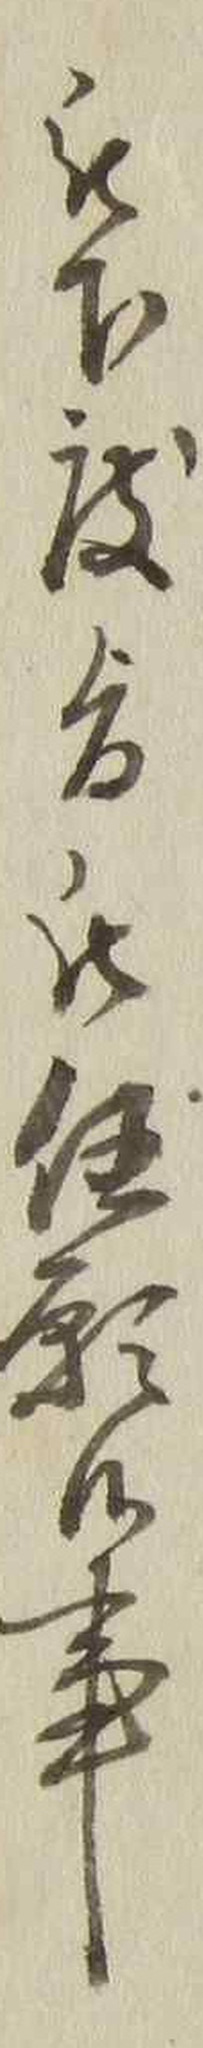被下度旨被任願候事
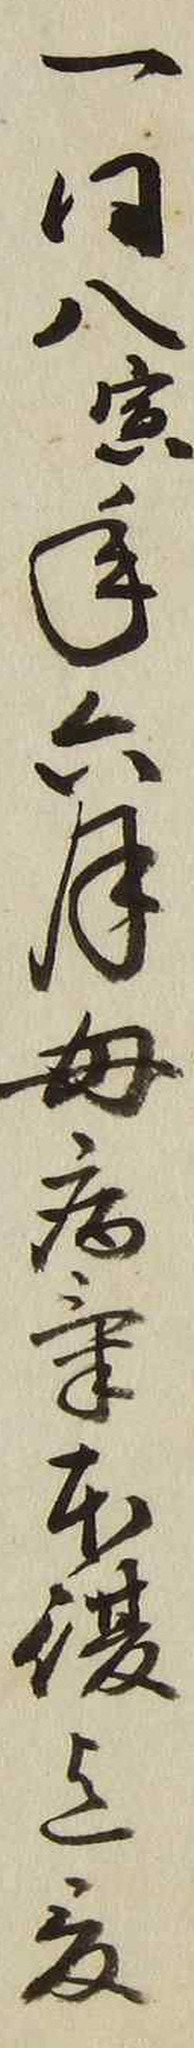一同八寅年六月母病気本復迄爰
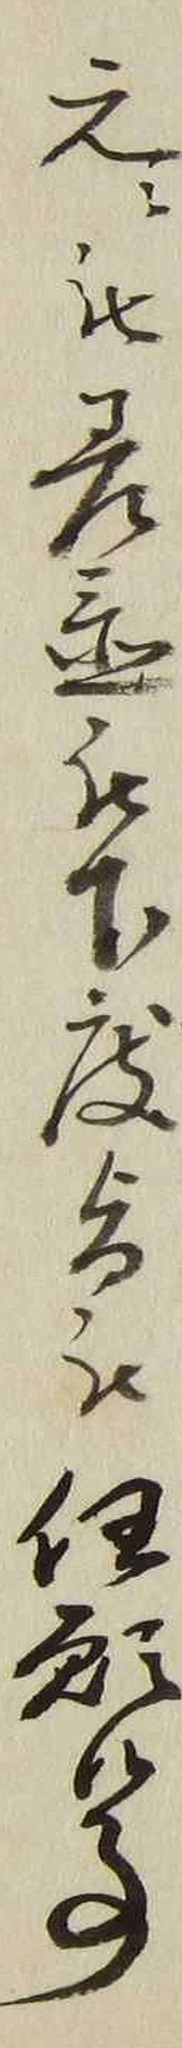元ニ被差置被下度旨被任願候事

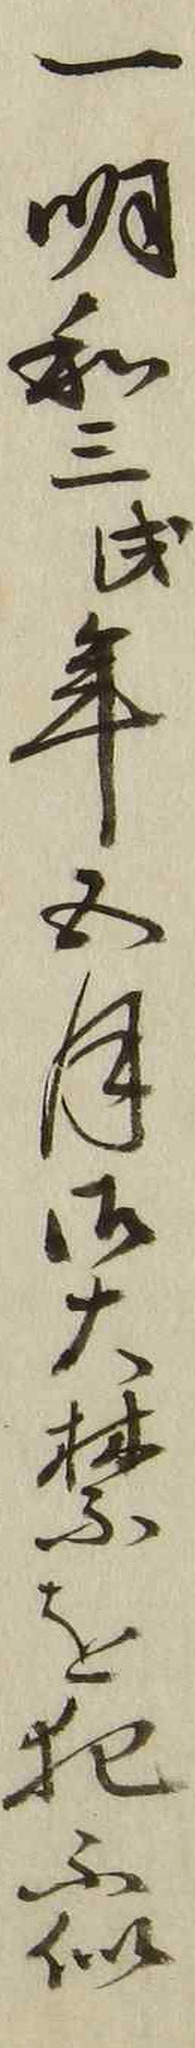一明和三戌年五月大禁を犯不似
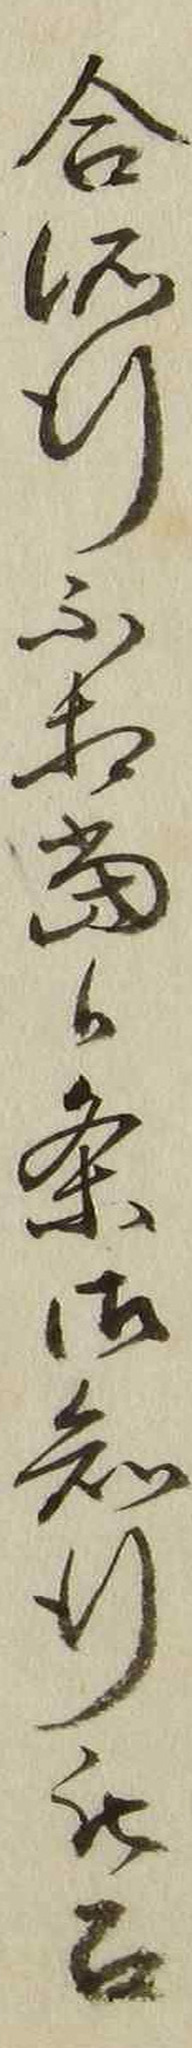合所行不相当候条御知行被召
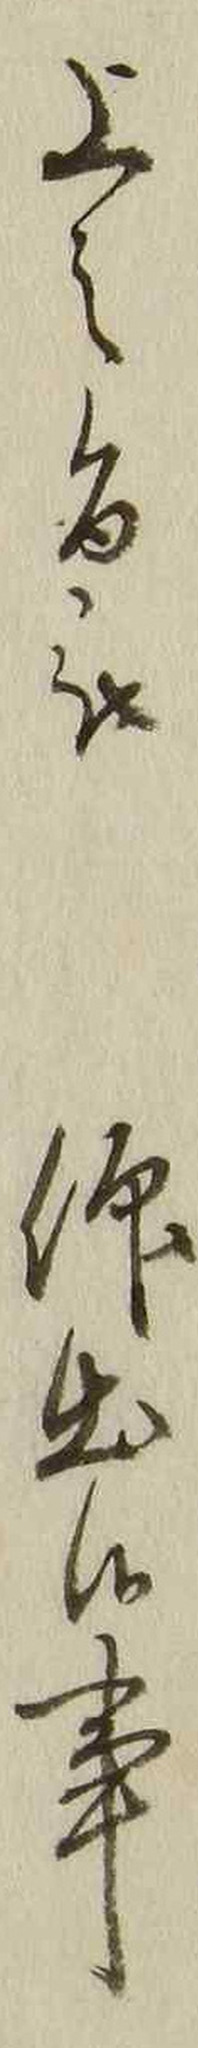上之旨被仰出候事
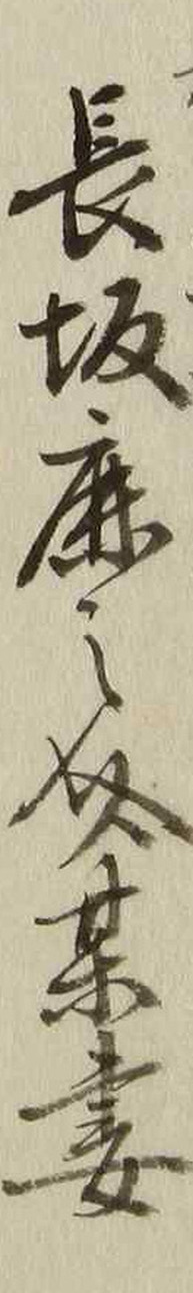女長坂鹿之介某妻
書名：諸士系譜　巻之31　い之部31
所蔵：会津若松市立会津図書館
